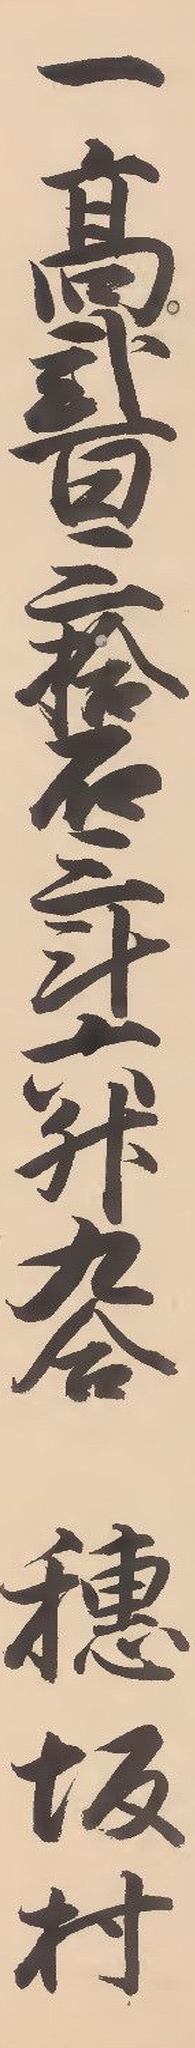一高弐百三拾石三斗六升九合穂坂村
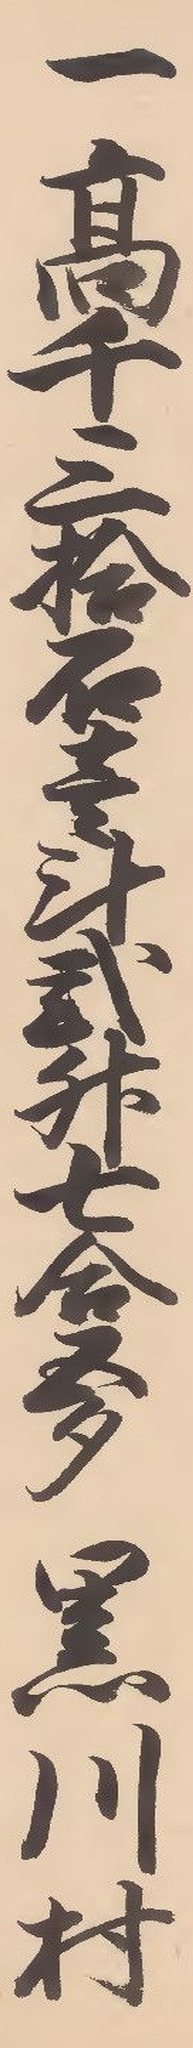一高千三拾石壱斗弐升七合五勺黒川村
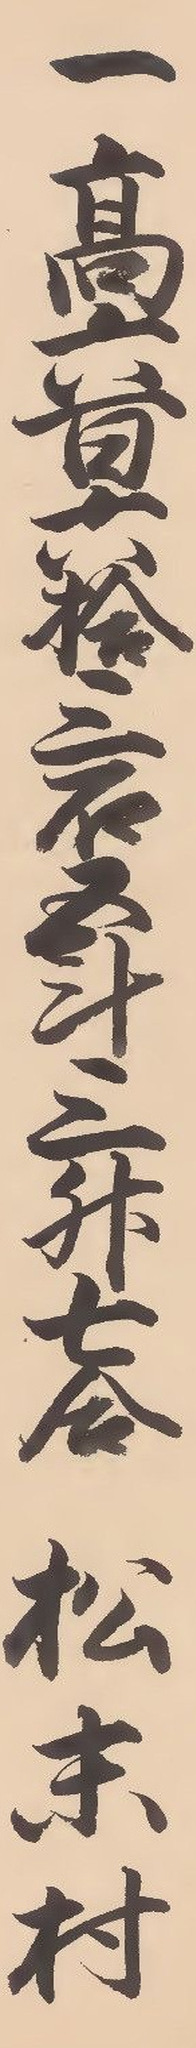一高六百六拾三石五斗三升七合松末村
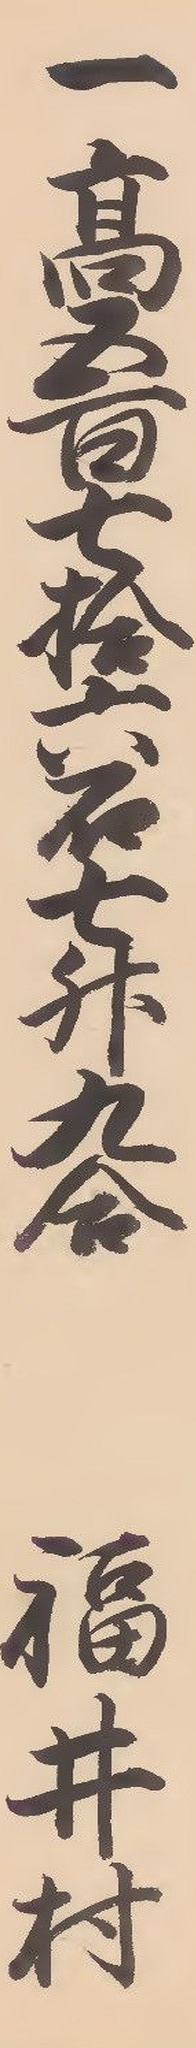一高五百七拾六石七升九合福井村

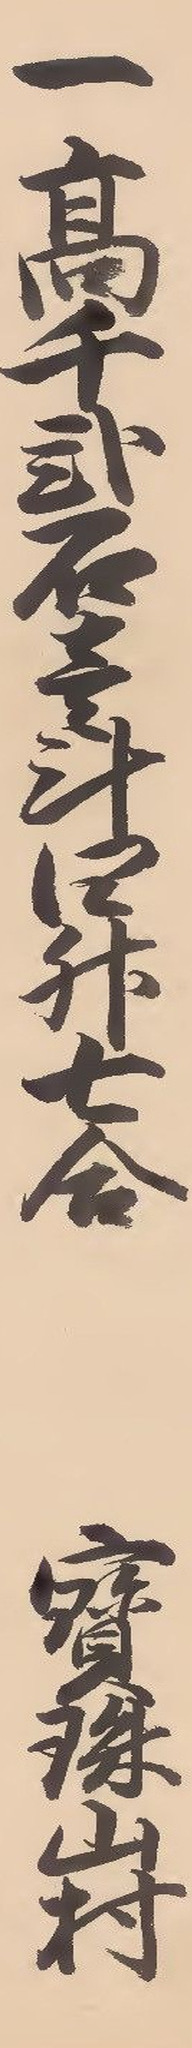一高千弐石壱斗四升七合宝珠山村
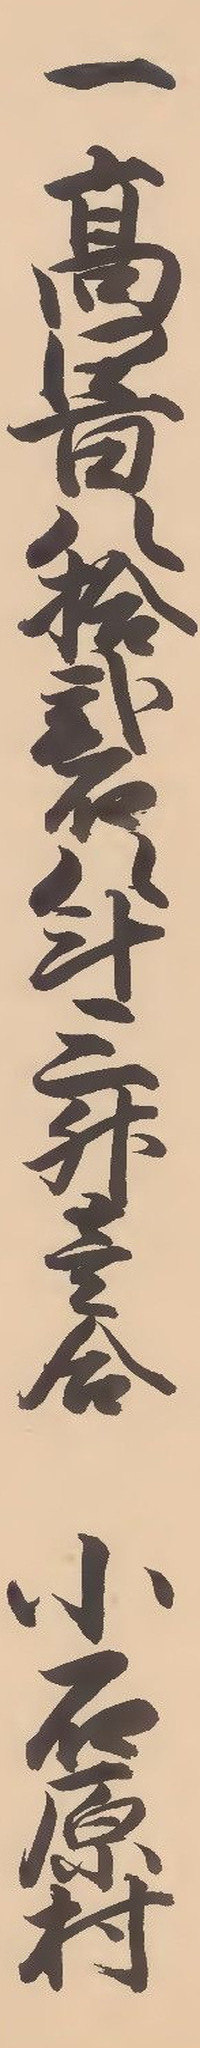一高四百八拾弐石八斗三升壱合小石原村
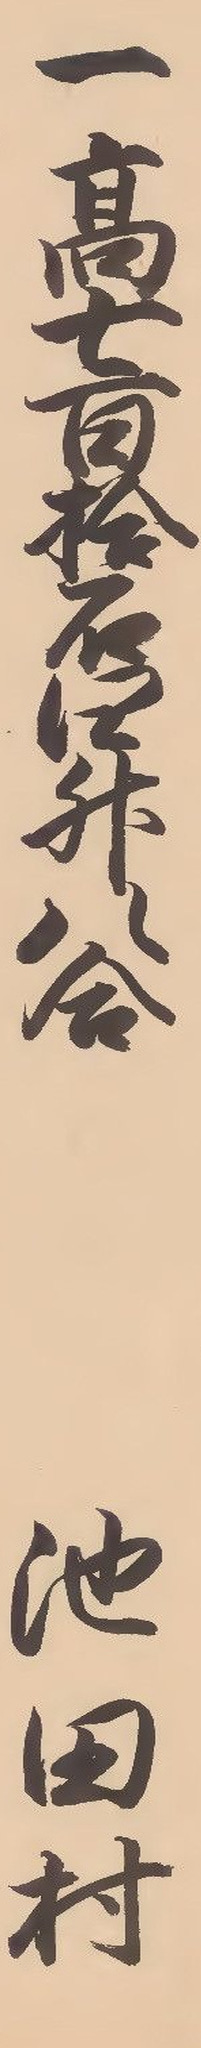一高七百拾石四升八合池田村
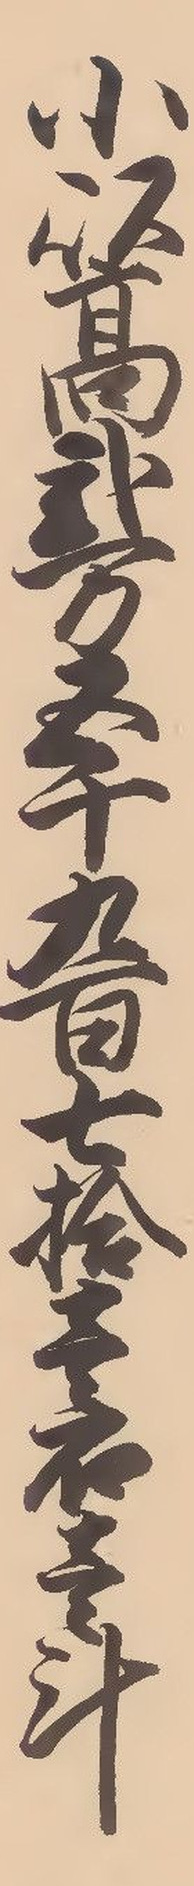小以高弐万五千九百七拾壱石壱斗

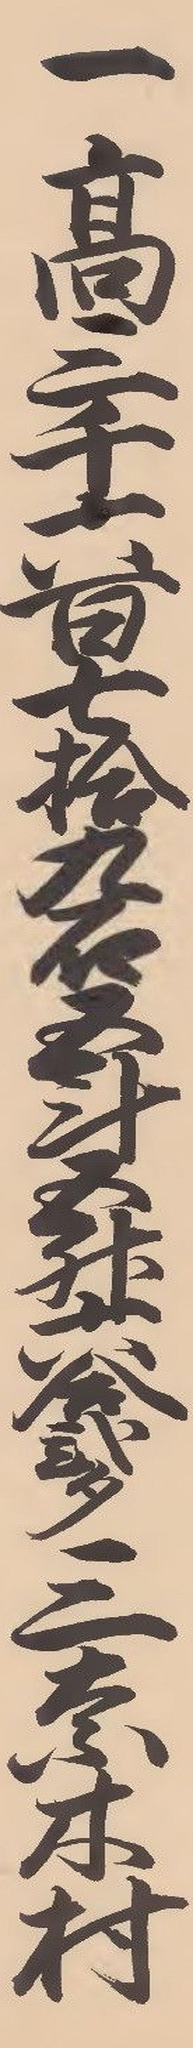一高三千六百七拾九石五斗五升六合弐勺三奈木村
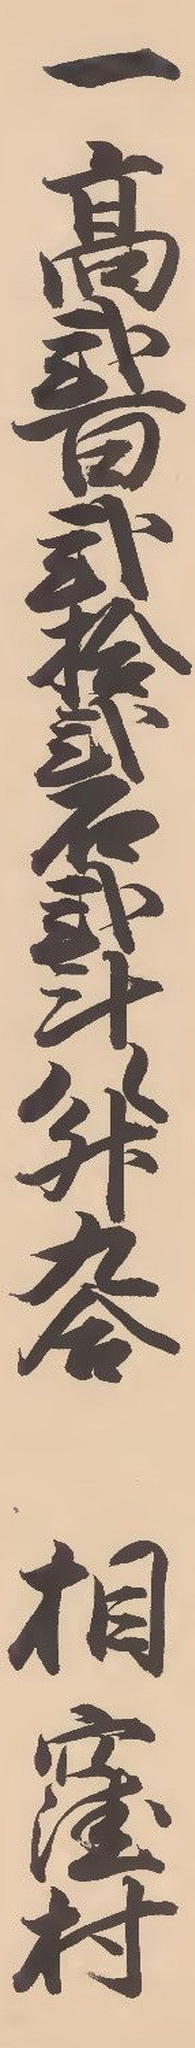一高弐百弐拾弐石弐斗八升九合相窪村
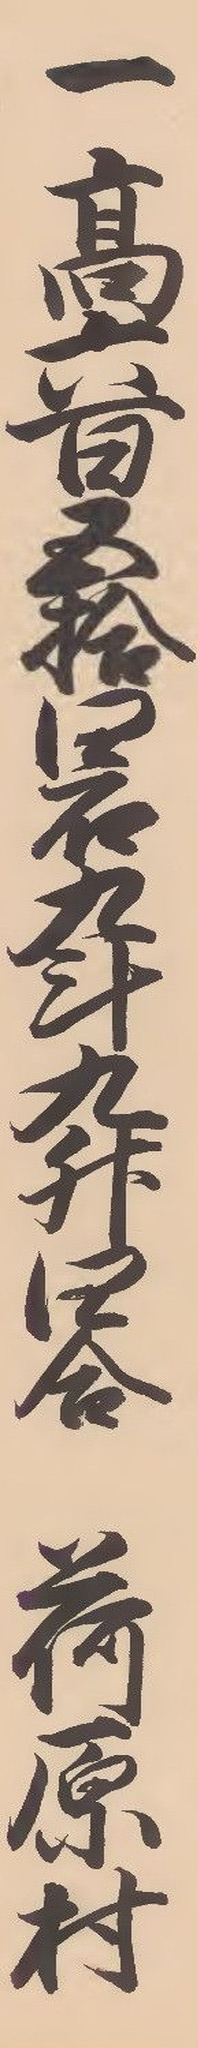一高六百五拾四石九斗九升四合荷原村

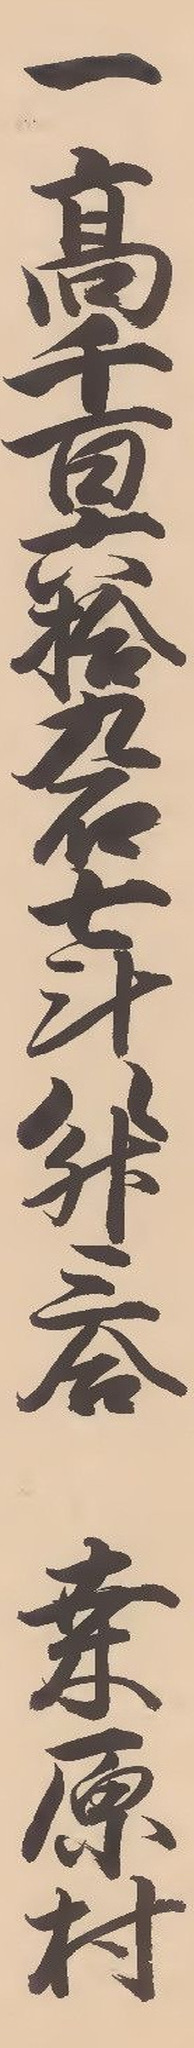一高千百六拾九石七斗八升三合桑原村
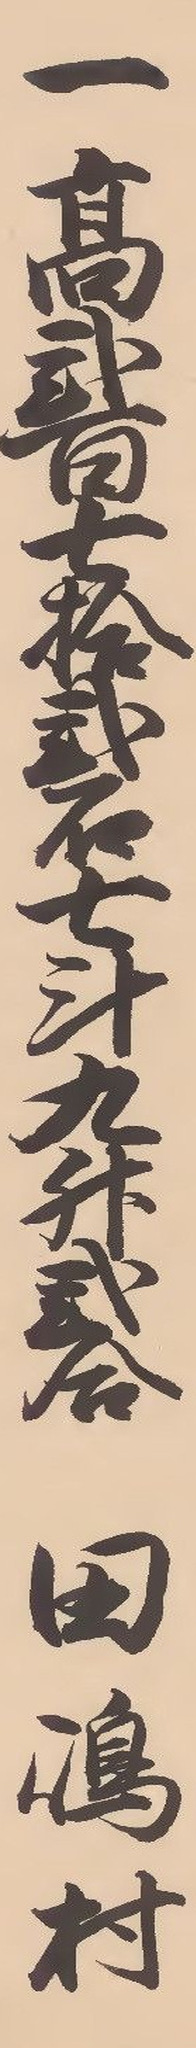一高弐百七拾弐石七斗九升弐合田島村
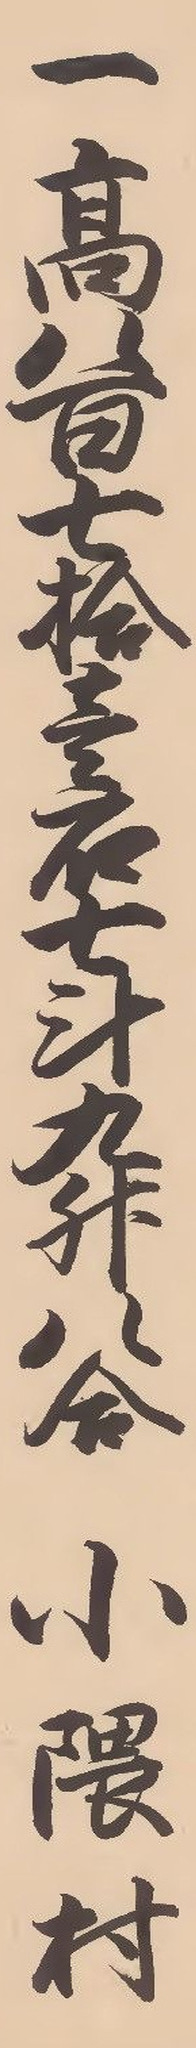一高八百七拾壱石七斗九升八合小隈村
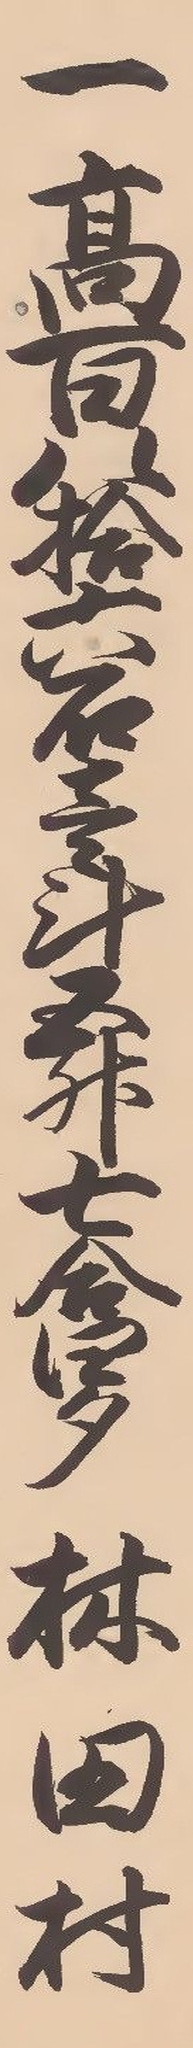一高百八拾六石壱斗五升七合四勺林田村
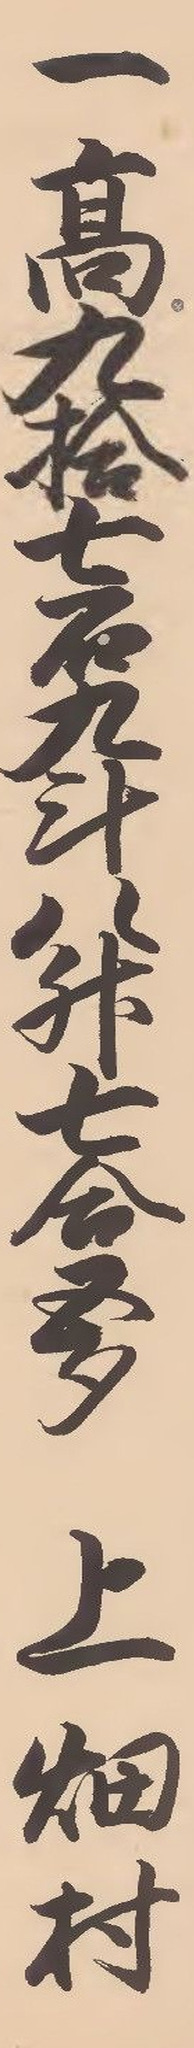一高九拾七石九斗八升七合五勺上畑村
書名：筑前国郷帳
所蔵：国立公文書館 National Archives of Japan
